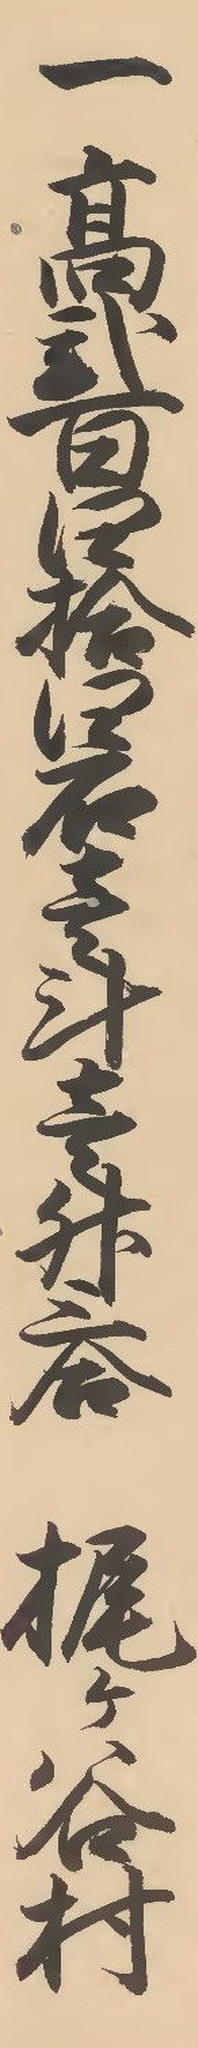一高弐百四拾四石壱斗壱升三合梶ヶ谷村

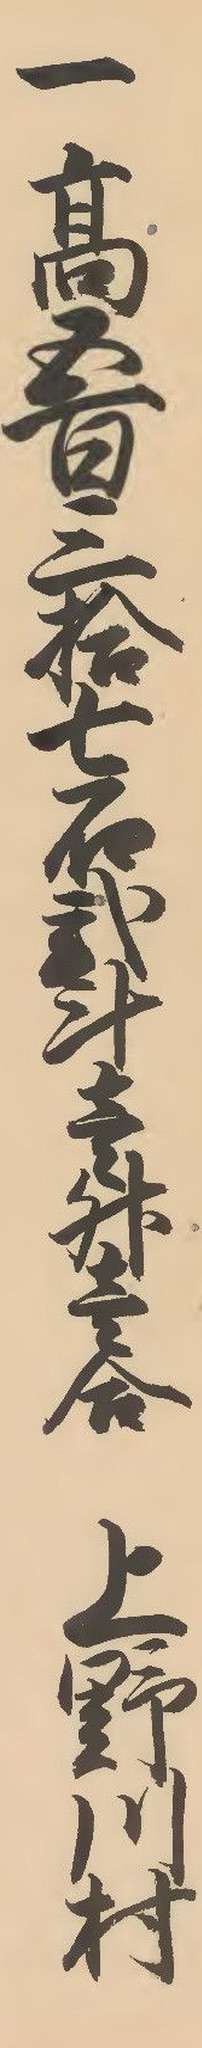一高五百三拾七石弐斗壱升壱合上野川村
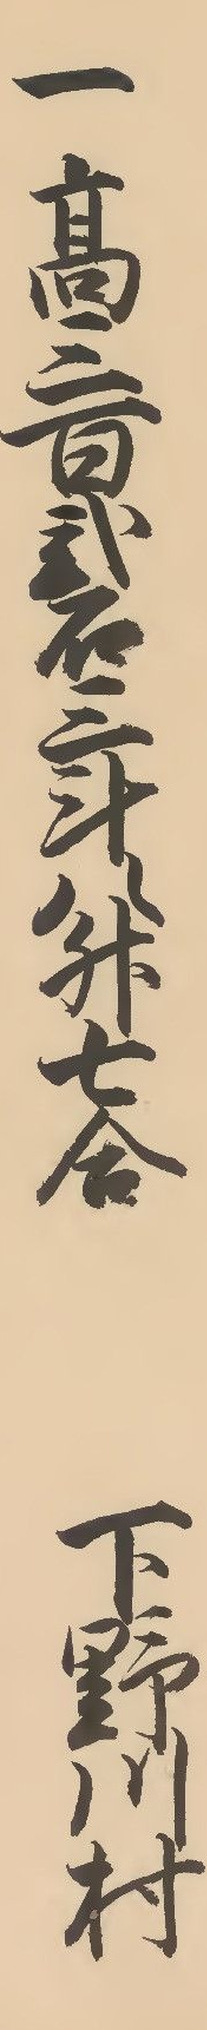一高三百弐石三斗八升七合下野川村
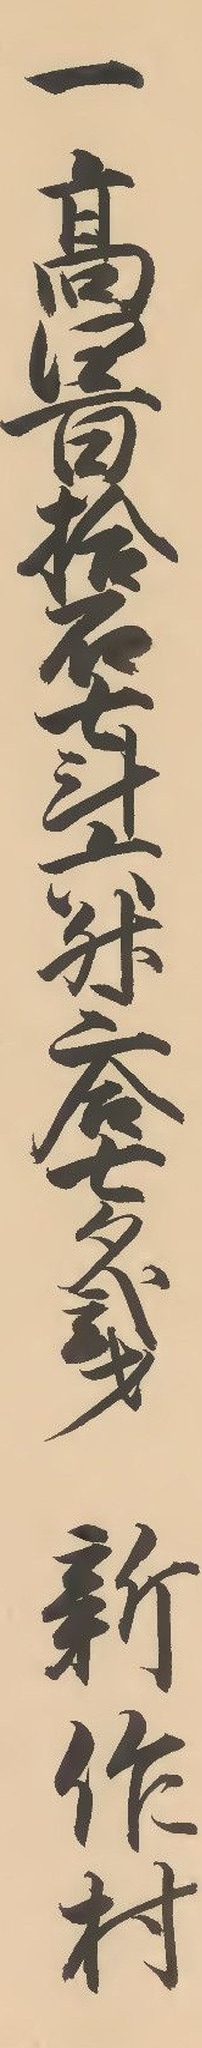一高四百拾石七斗六升三合七勺弐才新作村
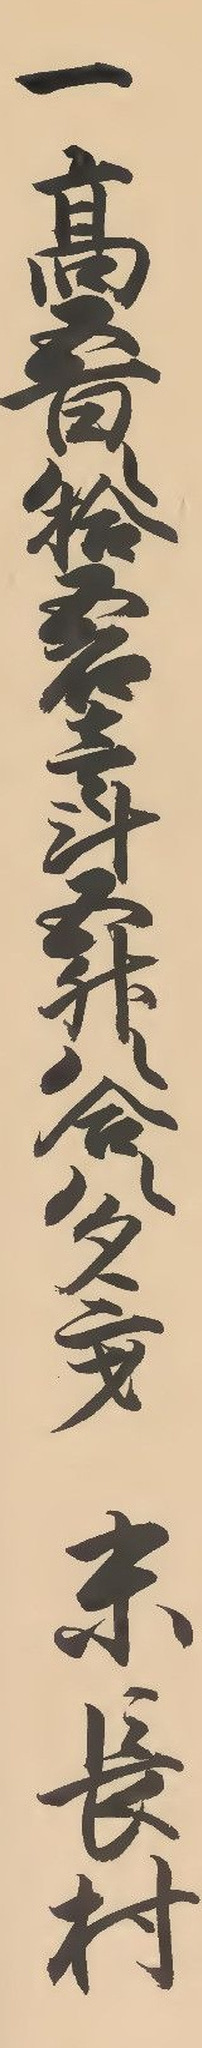一高五百八拾五石壱斗五升八合八勺三才末長村
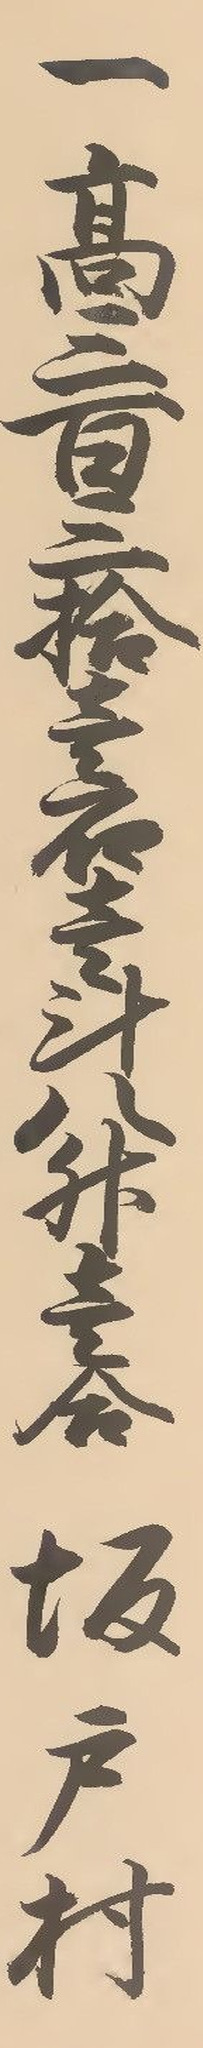一高三百三拾壱石壱斗八升壱合坂戸村
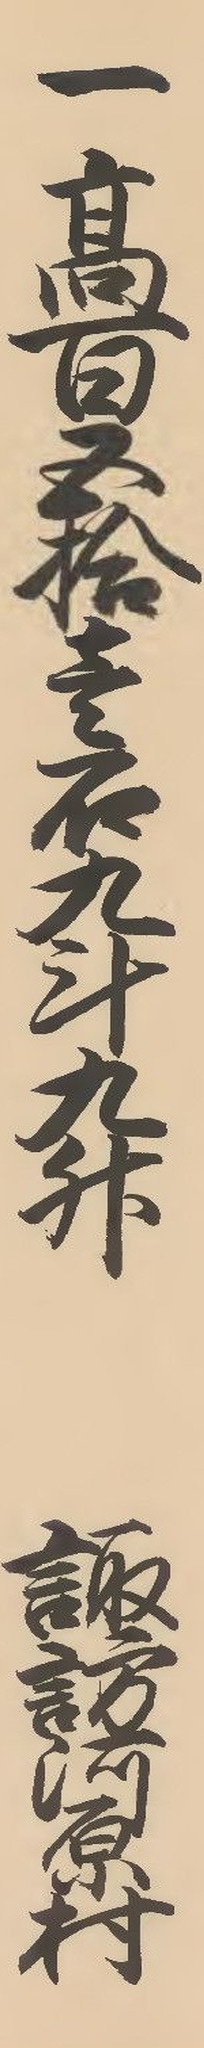一高百五拾壱石九斗九升諏訪河原村
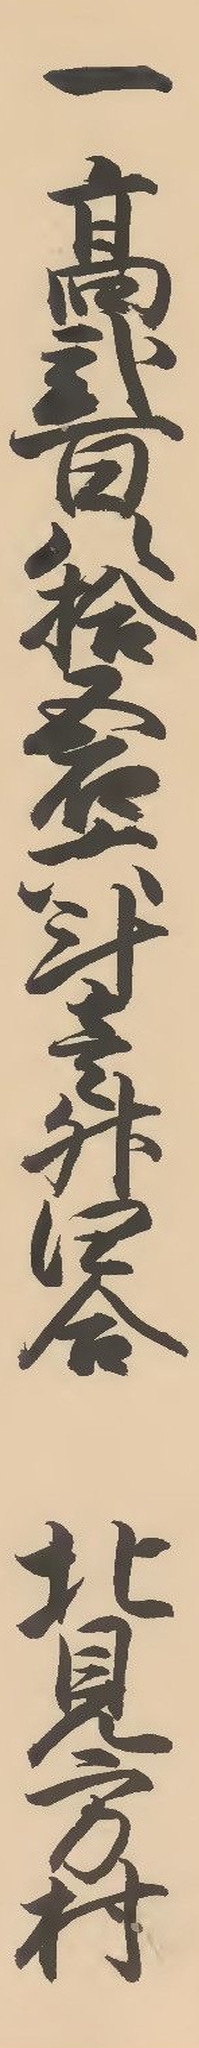一高弐百八拾五石六斗壱升四合北見方村
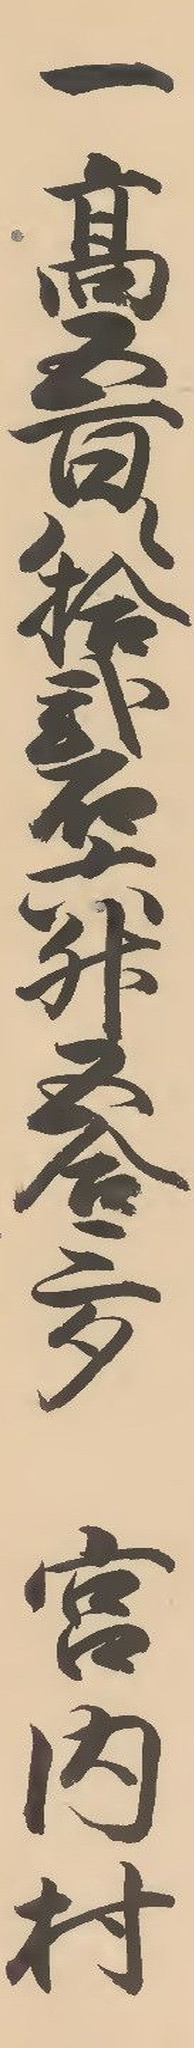一高五百八拾弐石六升五合三勺宮内村

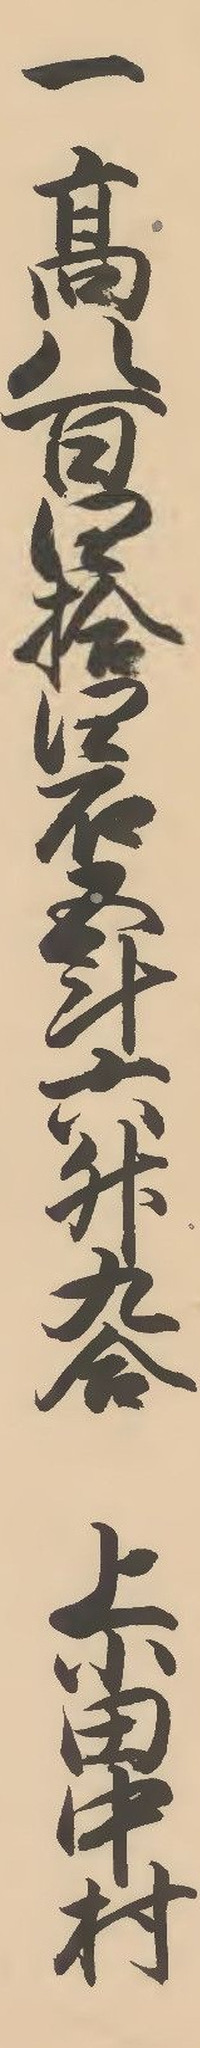一高八百四拾四石五斗六升九合上小田中村
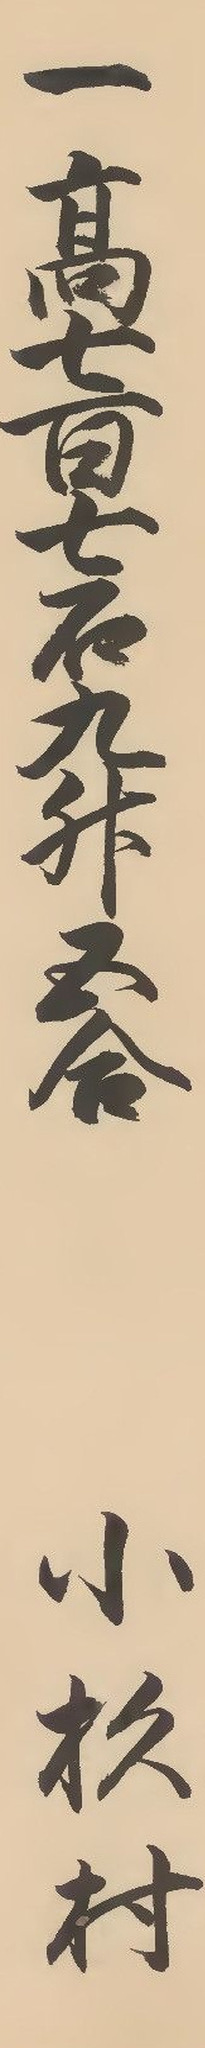一高七百七石九升五合小杉村
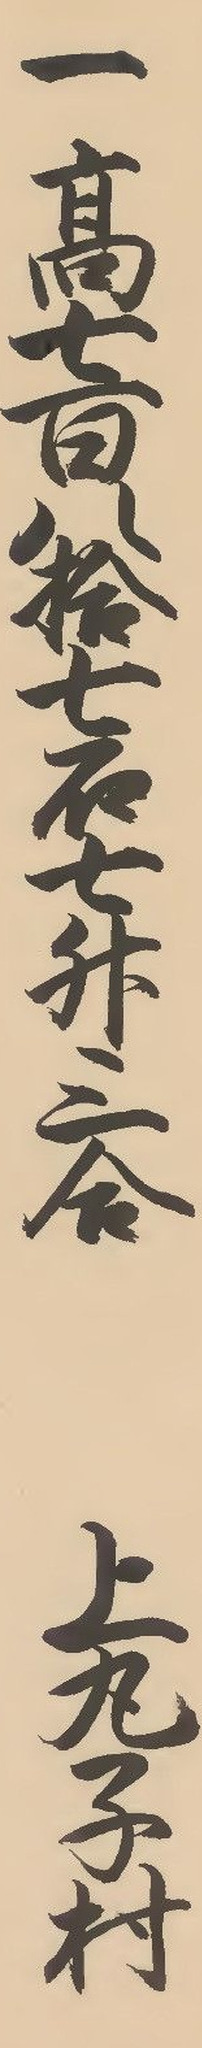一高七百八拾七石七升三合上丸子村
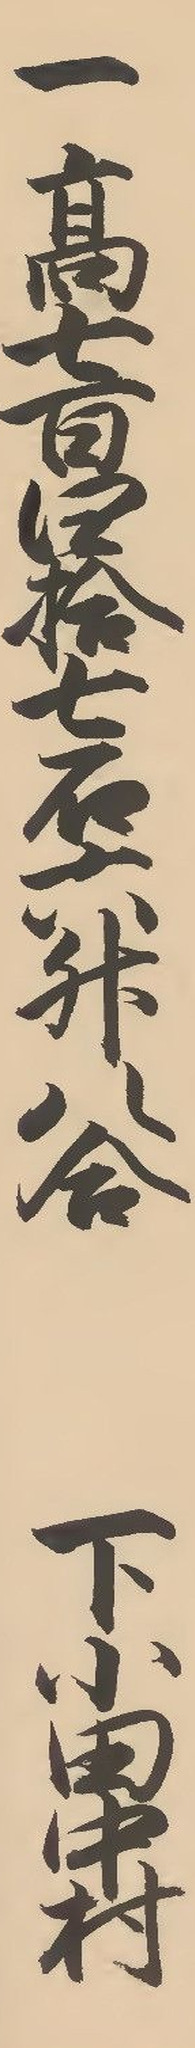一高七百四拾七石六升八合下小田中村
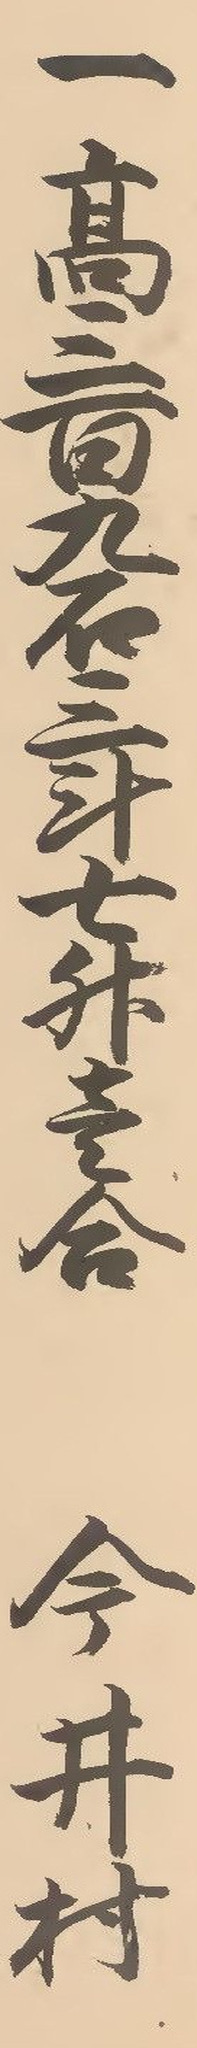一高三百九石三斗七升壱合今井村
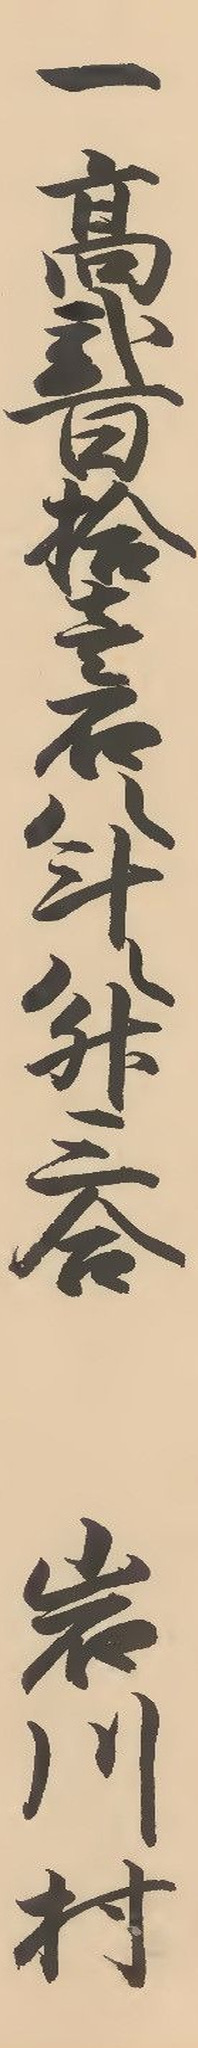一高弐百拾壱石八斗八升三合岩川村
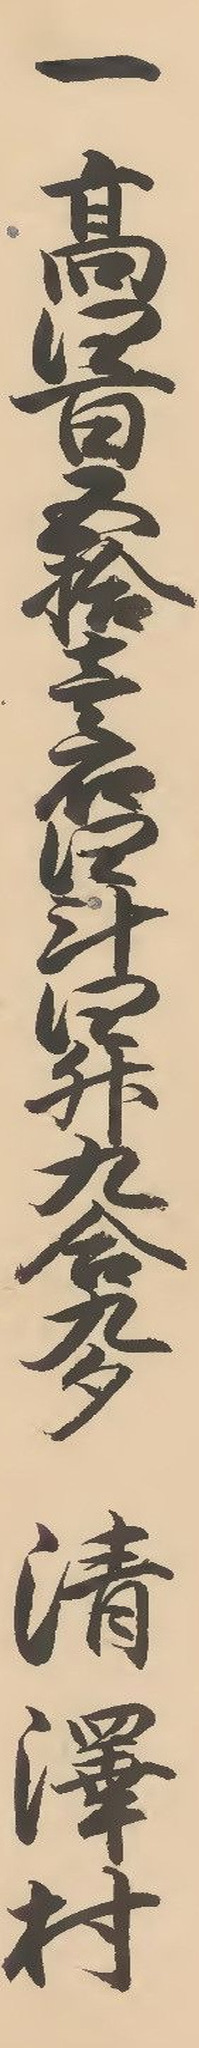一高四百五拾壱石四斗四升九合九勺清澤村
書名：武蔵国郷帳　上
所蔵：国立公文書館 National Archives of Japan
